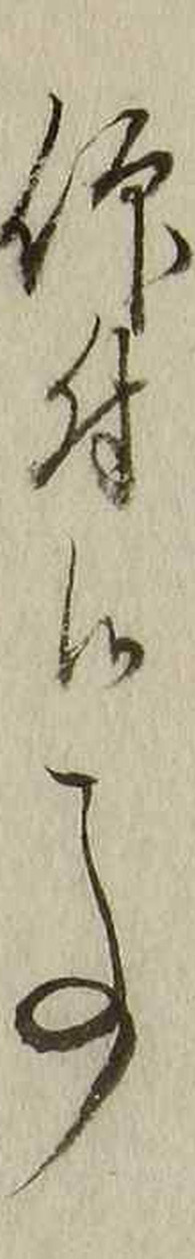仰付候事
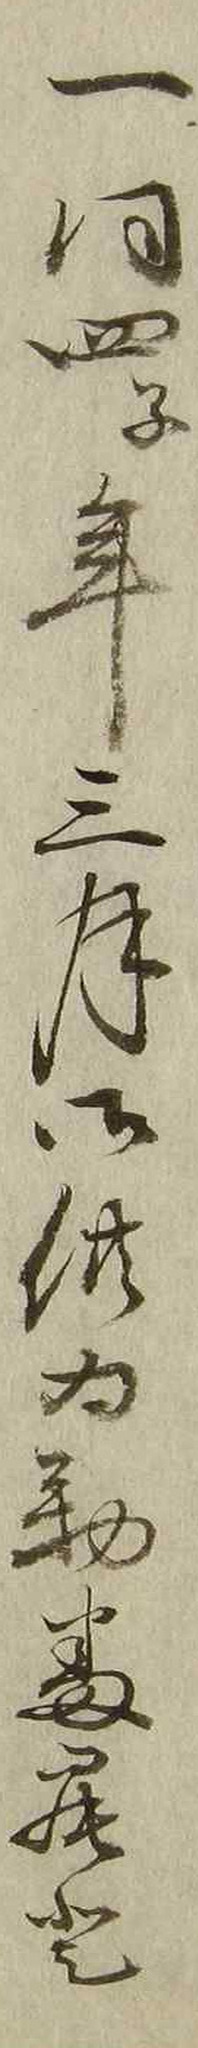一同四子年三月御供為勤番罷登
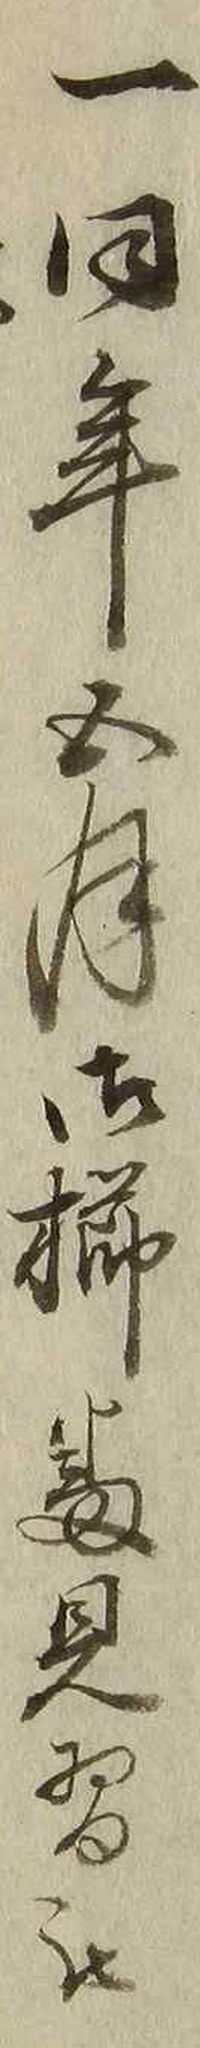一同年五月御櫛番見習被
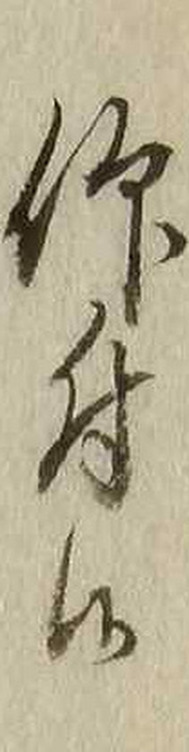仰付候
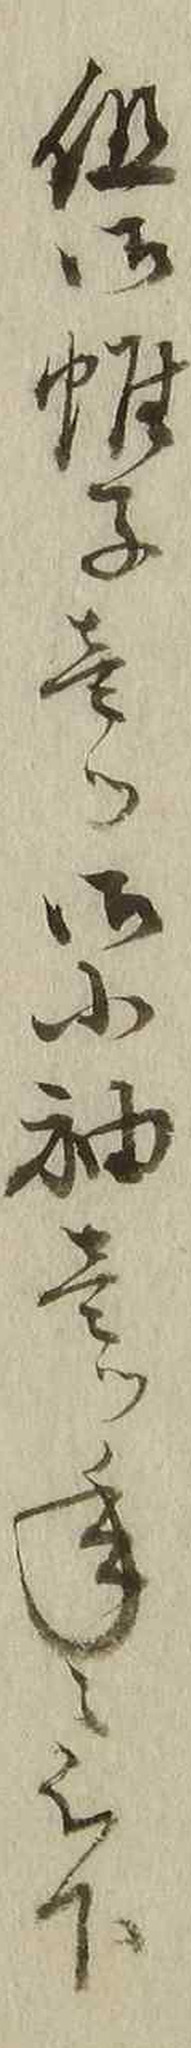但御帷子壱ツ御小袖壱ツ年々被下
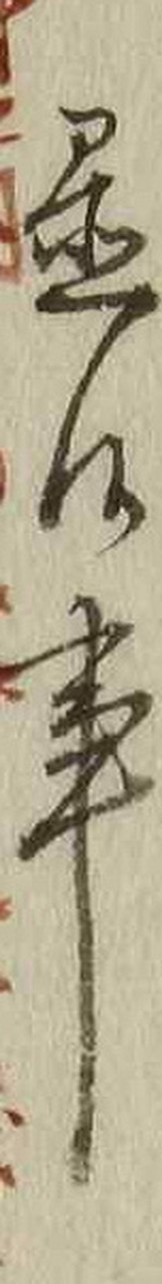置候事
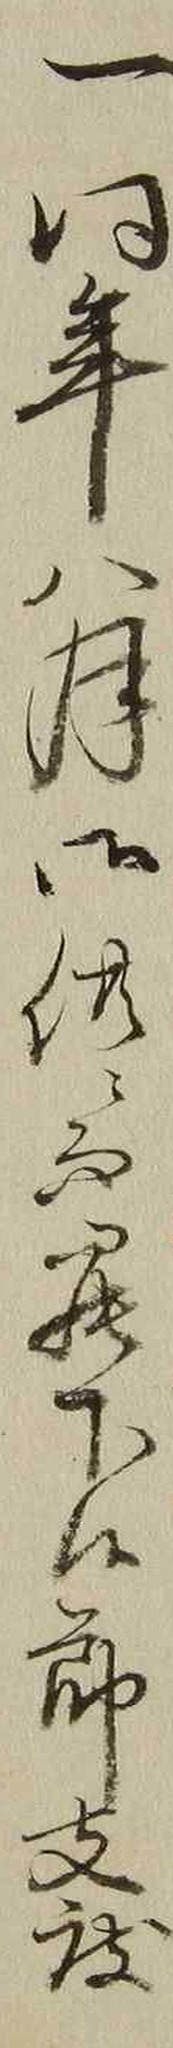一同年八月御供ニ而罷下候節支度
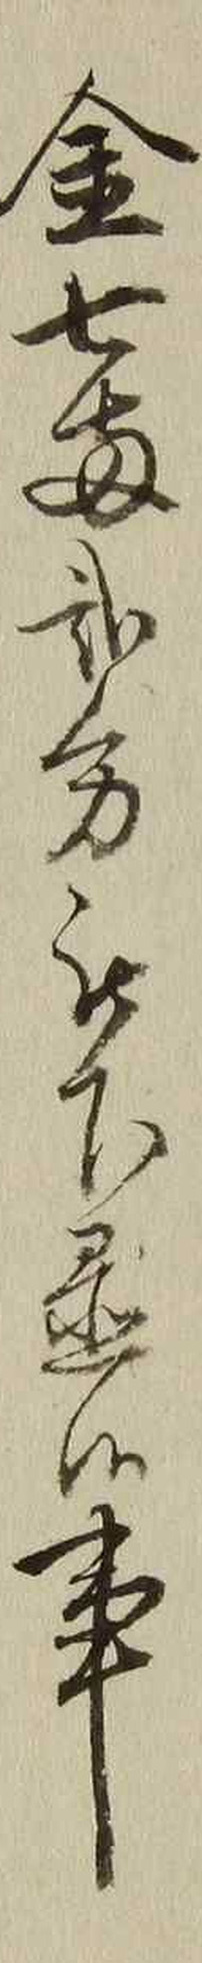金七両弐分被下置候事
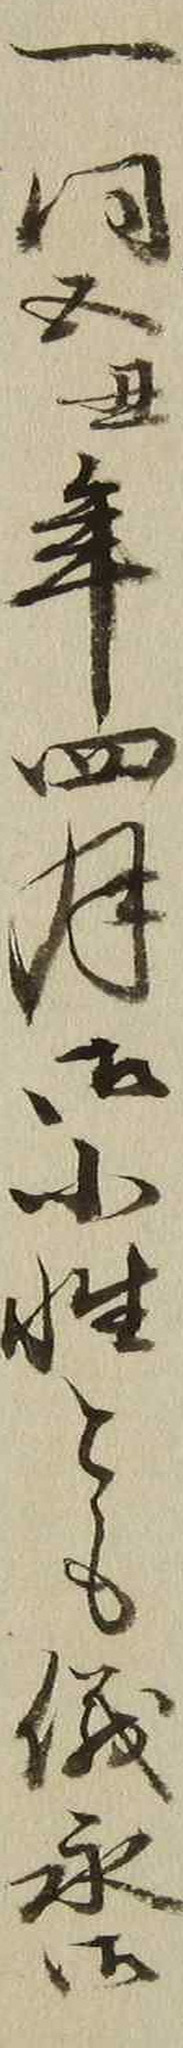一同五丑年四月御小性とも儀永御
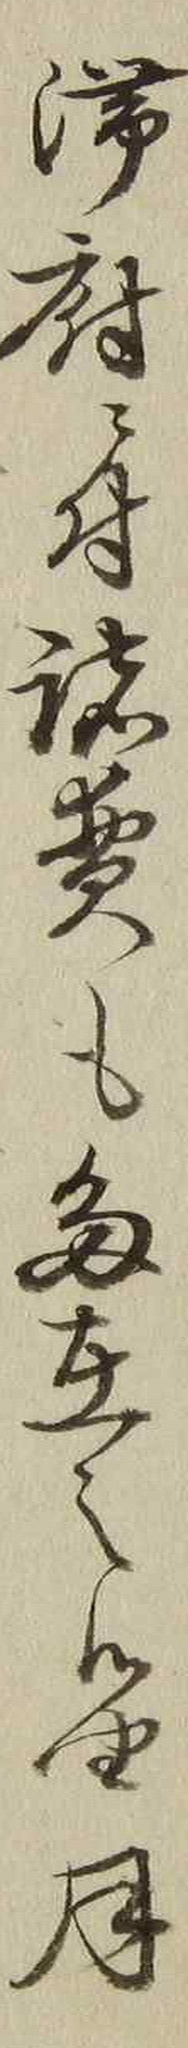滞府ニ付諸費も多在之候由月
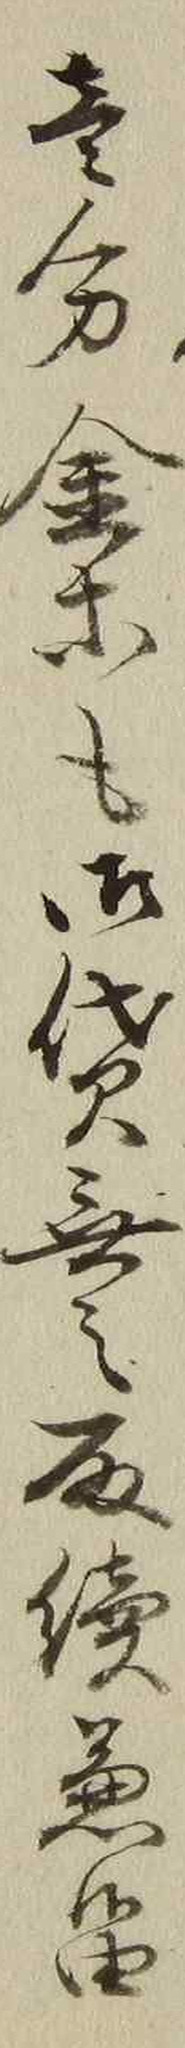壱分金等も御貸無之取続兼候由
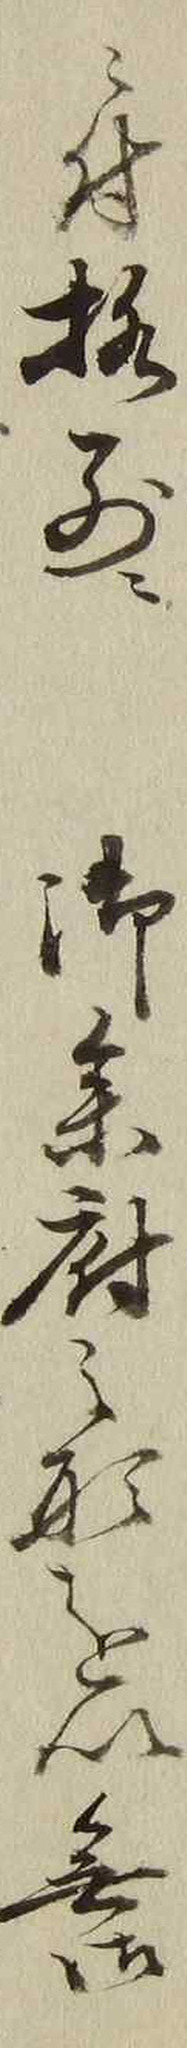ニ付格別ニ御参府之形を以無御
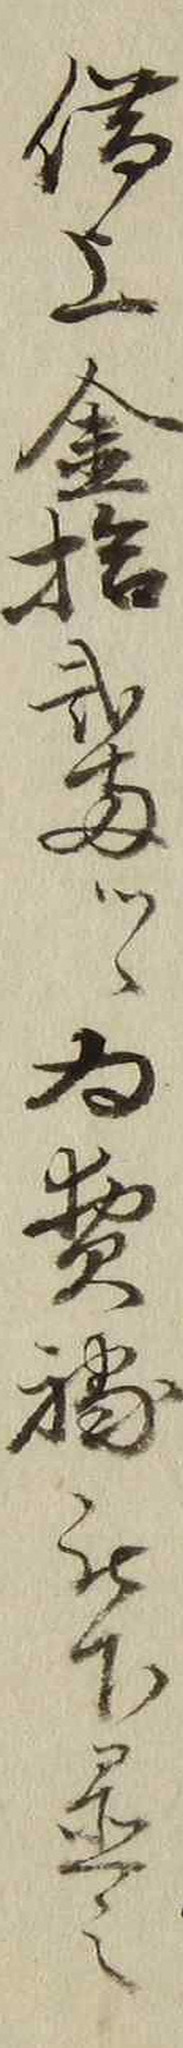借上金拾弐両ツヽ為費補被下置之
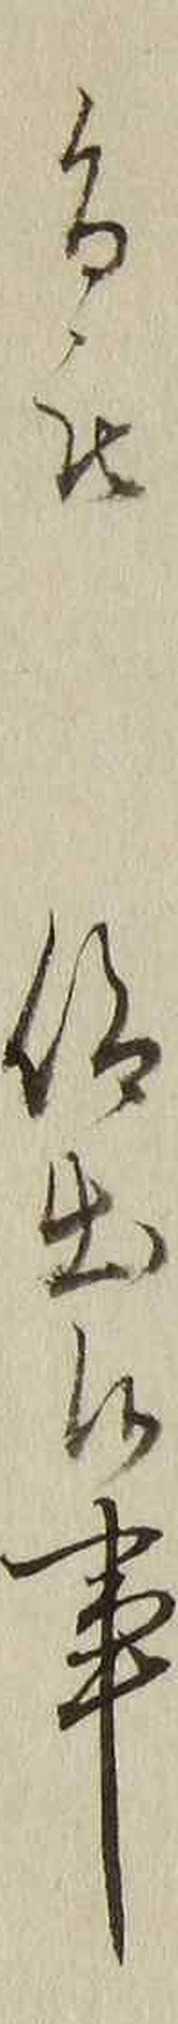旨被仰出候事
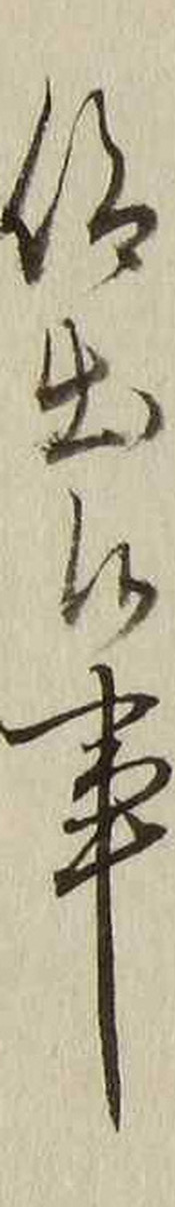仰付候事
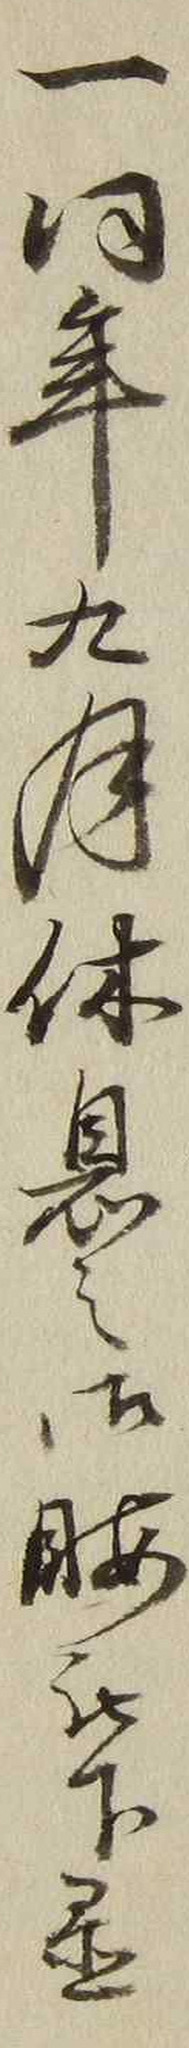一同年九月休息之御暇被下置
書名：諸士系譜　巻之36　は之部4
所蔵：会津若松市立会津図書館
